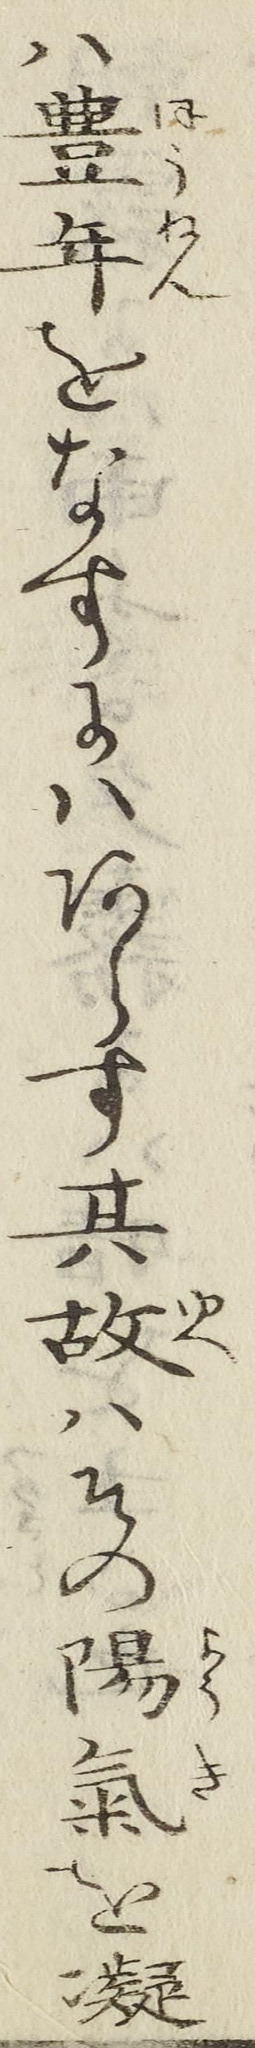は豊年をなすにはあらす其故はその陽気を凝
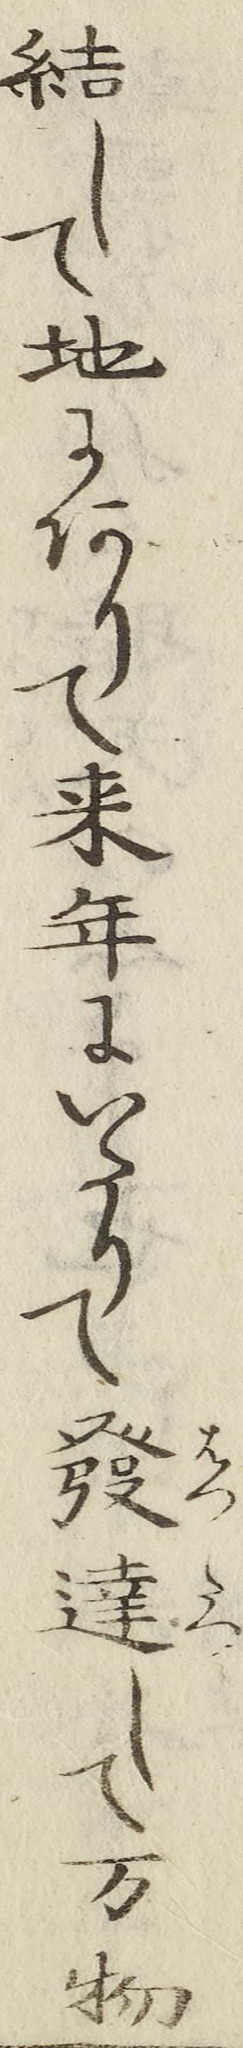結して地にありて来年にいたりて発達して万物
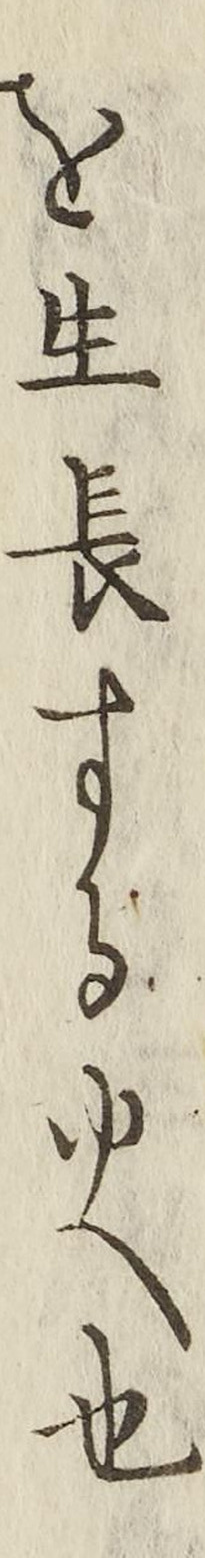を生長するゆへ也
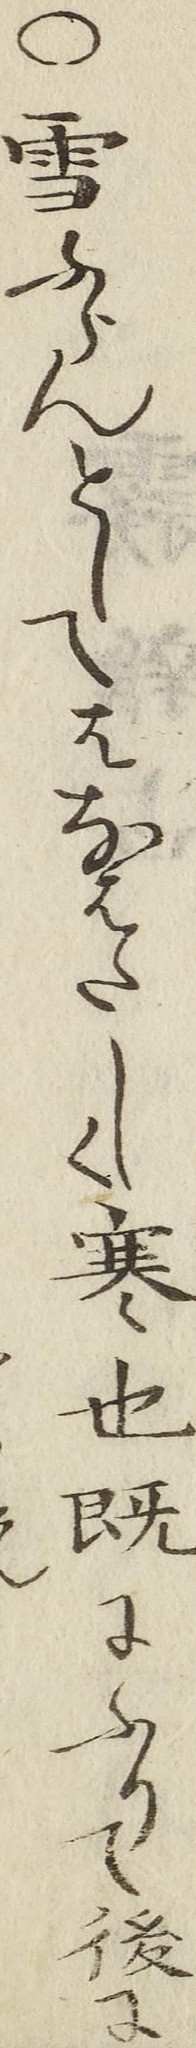○雪ふらんとしてはなはたしく寒也既にふりて後に

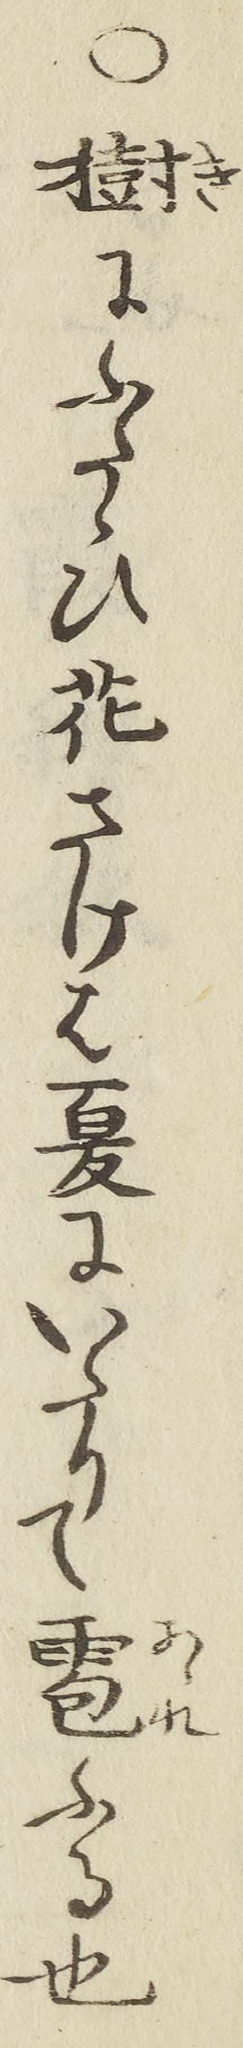〇樹にふたゝひ花さけは夏にいたりて雹ふる也
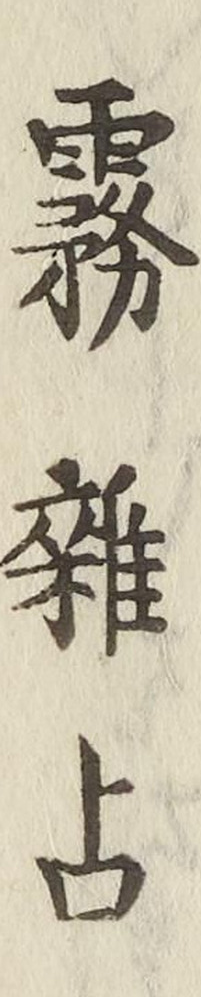霧雑占
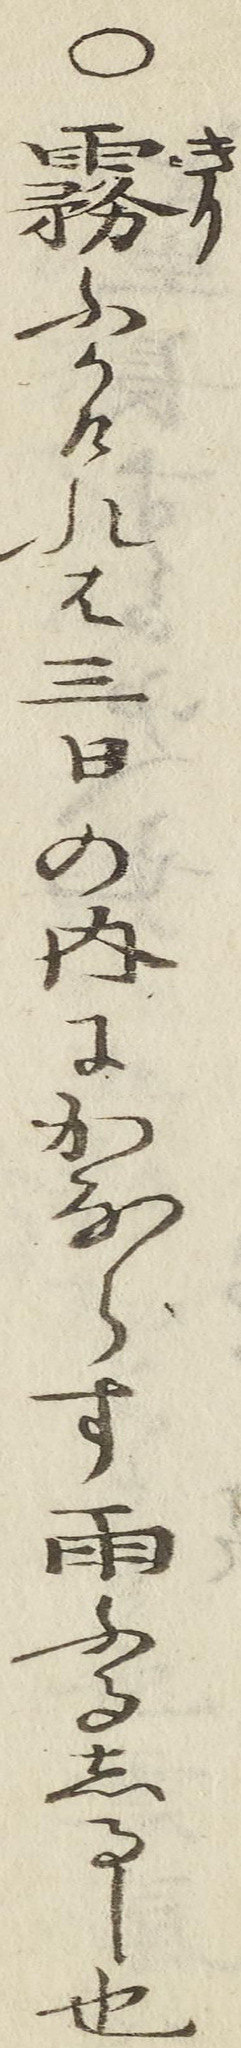〇霧ふかけれは三日の内にかならす雨ふるしるし也
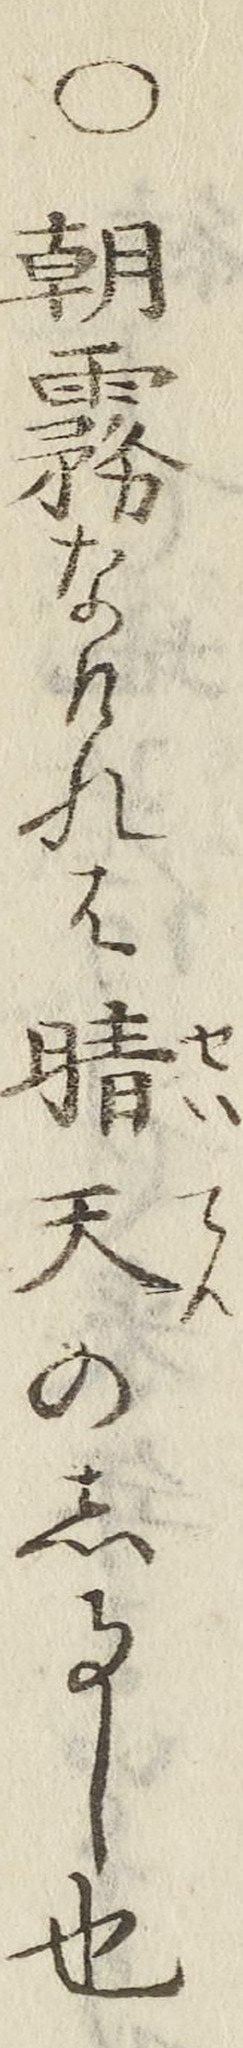〇朝霧なけれは晴天のしるし也
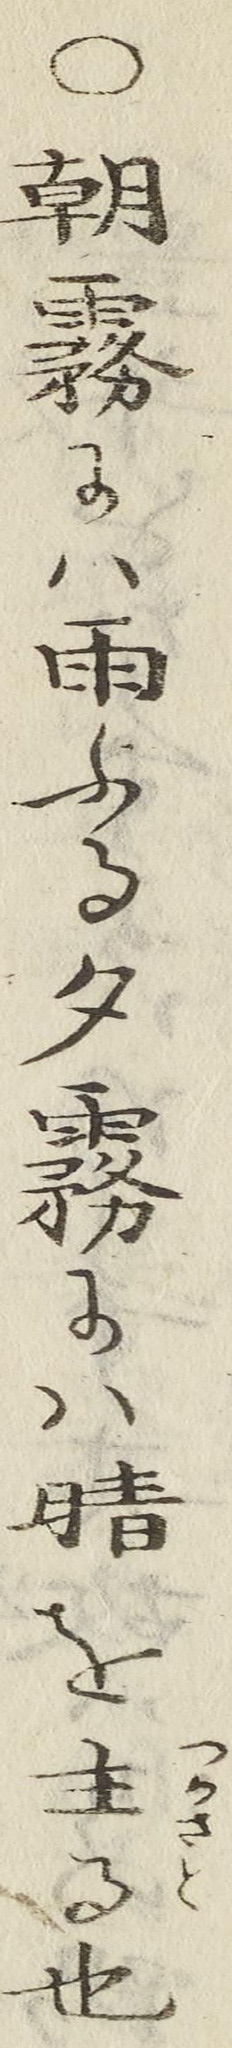〇朝霧には雨ふる夕霧には晴を主る也
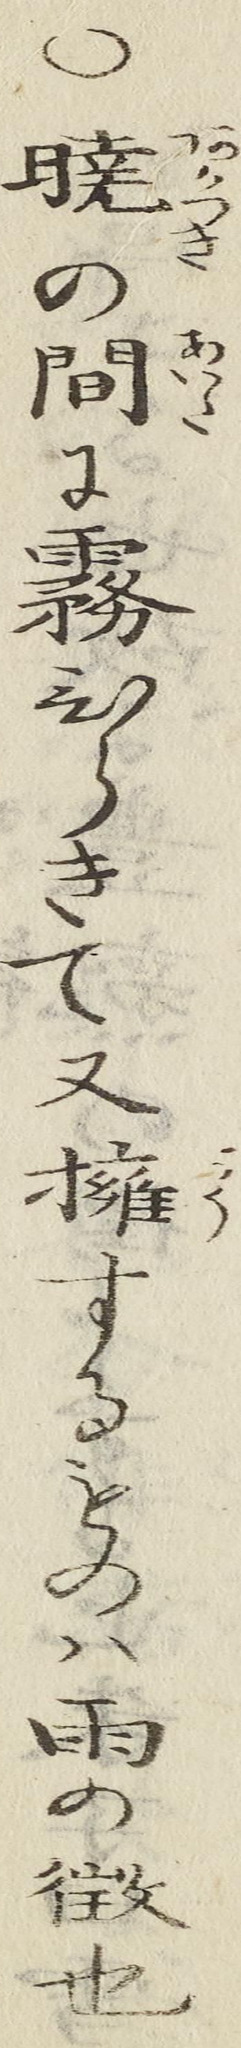〇暁の間に霧ひらきて又擁するものは雨の徴也
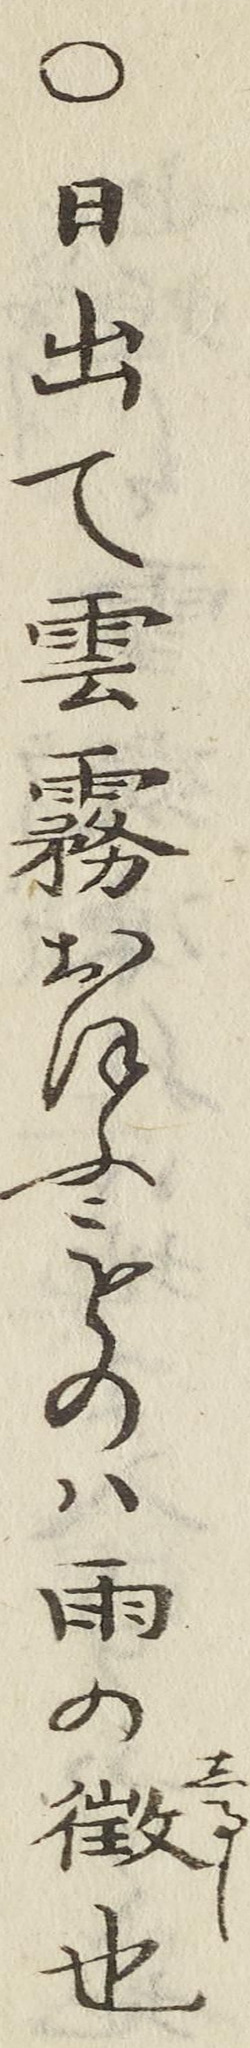〇日出て雲霧おほふものは雨の徴也
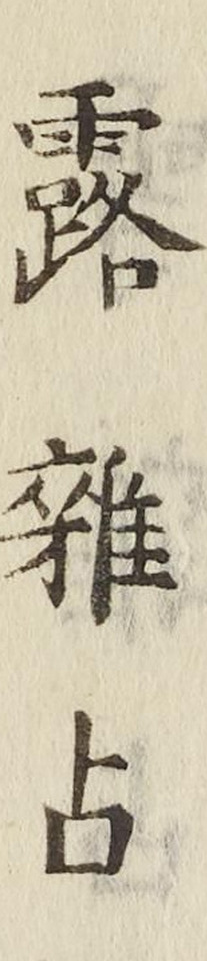露雑占
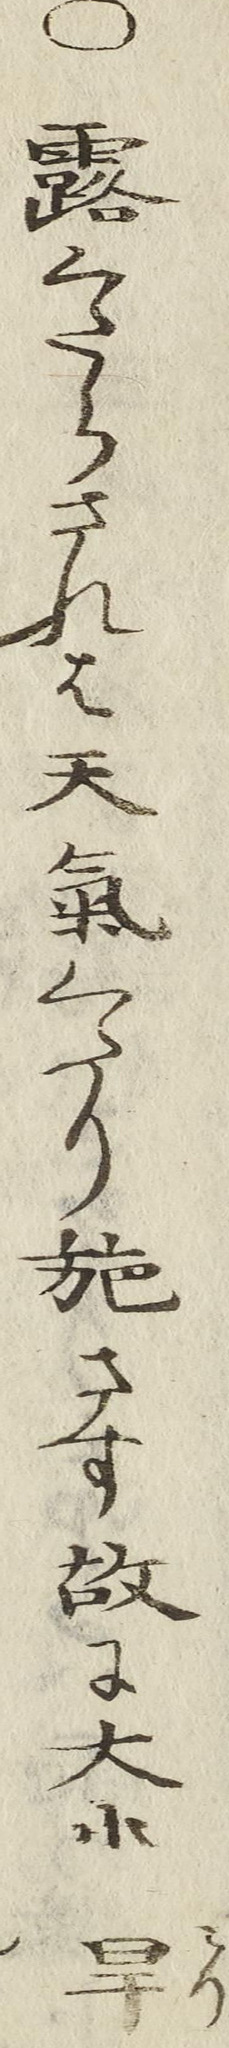〇露くたらされは天気くたり施さす故に大小旱
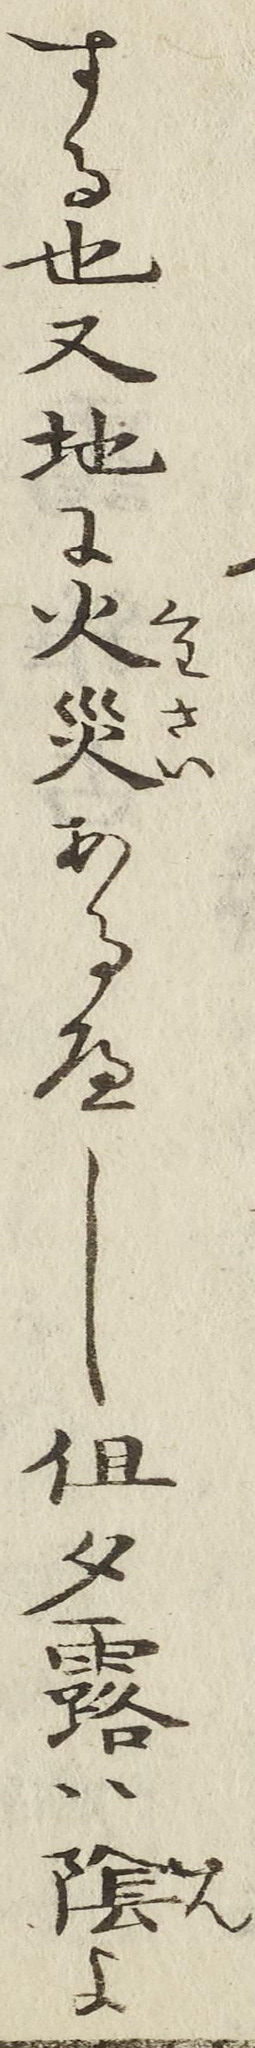する也又地に火災あるへし但夕露は陰よ
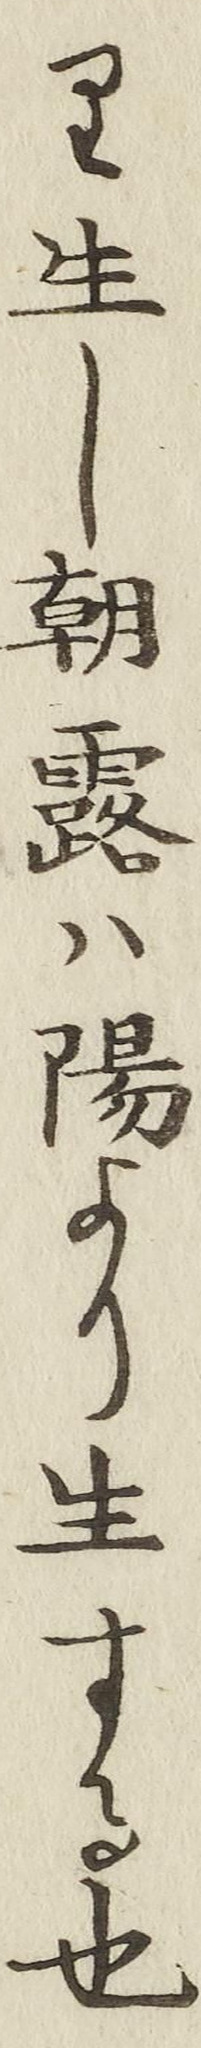り生し朝露は陽より生する也
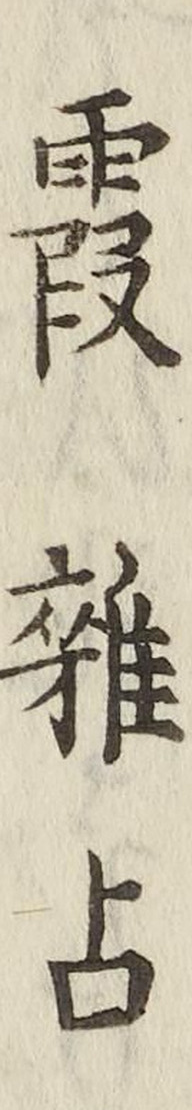霞雑占
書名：天時占候　二
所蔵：東京大学地震研究所図書室 Earthquake Research Institute Library, The University of Tokyo, JAPAN
